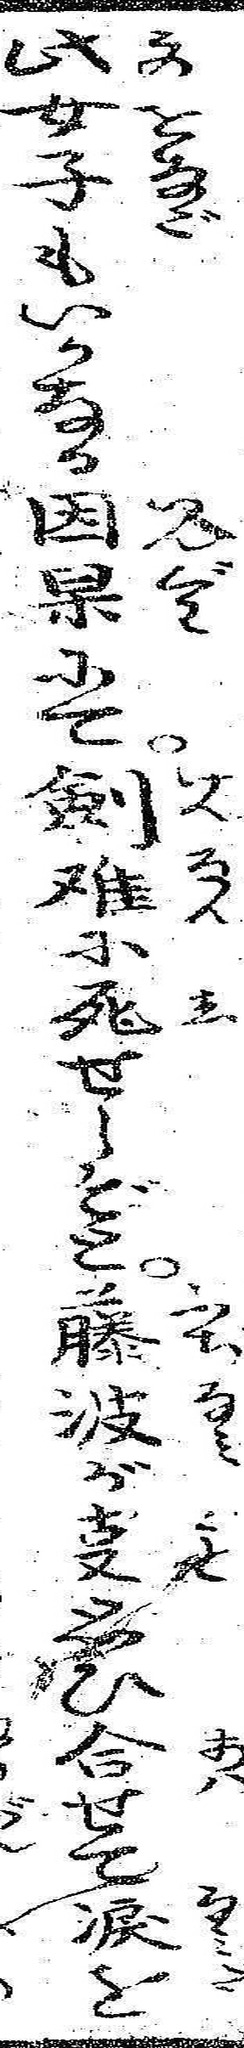此女子もいかなる因果にて。剣難に死せしぞと。藤波が事思ひ合せて涙を
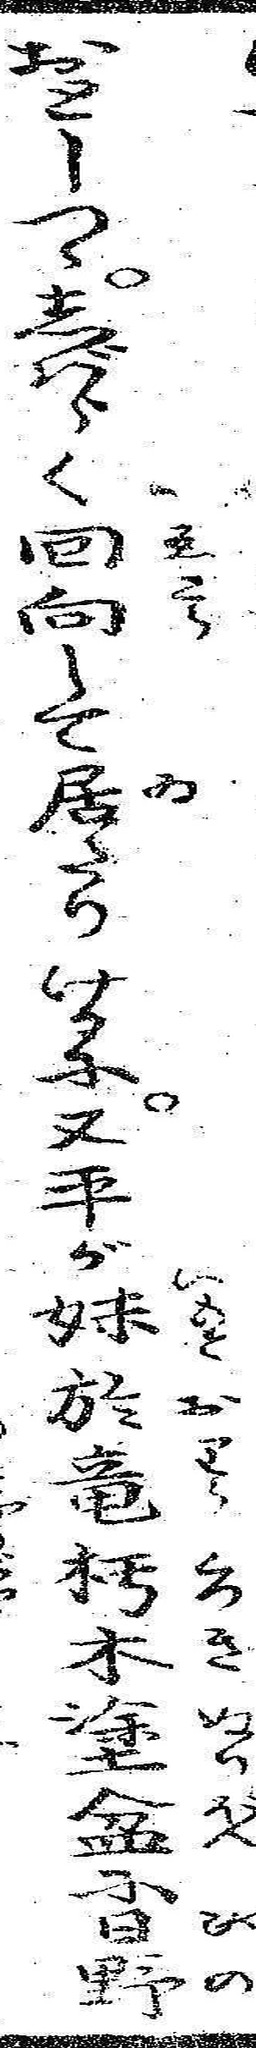おとしつゝ。しばらく回向して居たりけるに。又平が妹於竜朽木塗盆に日野
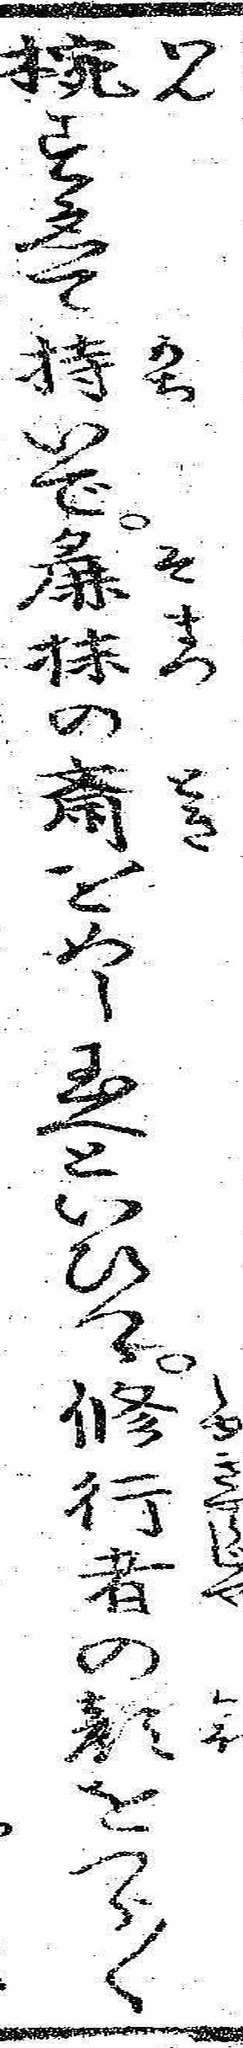椀すゑて持いで。麁抹の斎をめし玉へといひつゝ。修行者の顔をつら〳〵
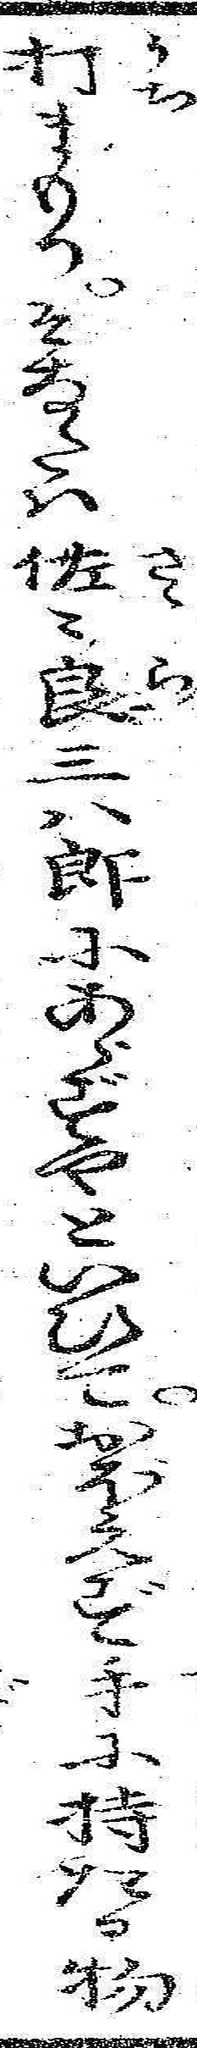打まもり。そなたは佐々良三八郎にあらずやといひて。おぼえず手に持たる物
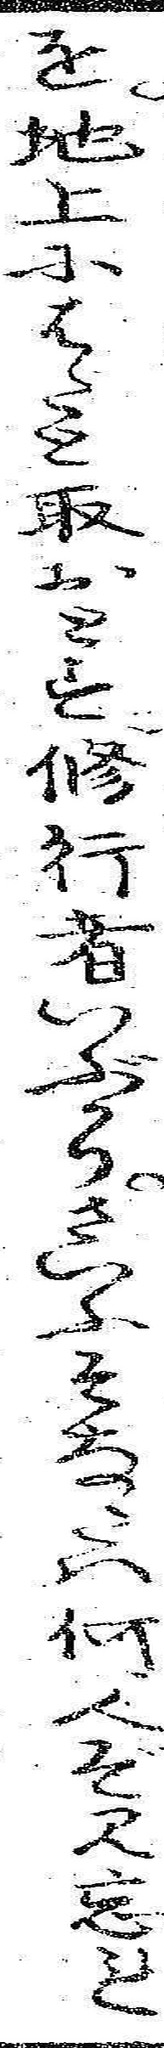を。地上にはたと取おとす。修行者いぶかり。さいふそなたは何人ぞ。見忘れ
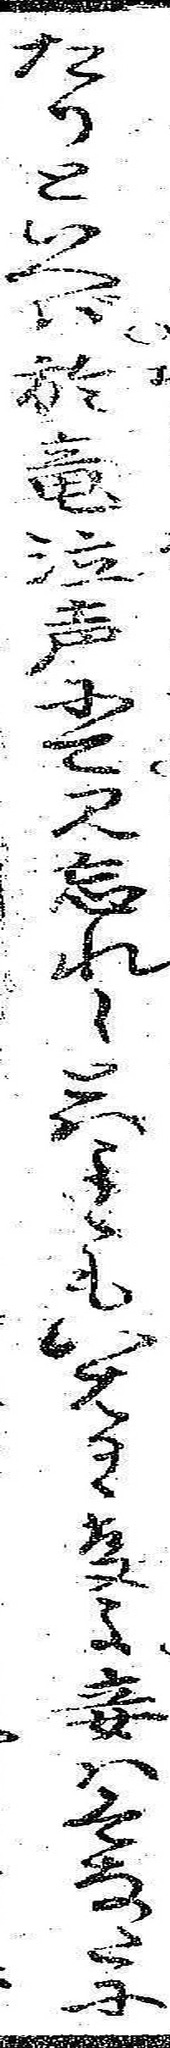たりといへば。於竜泣声にて。見忘れしとはよくもいはるゝ事よ。妾はそなたに
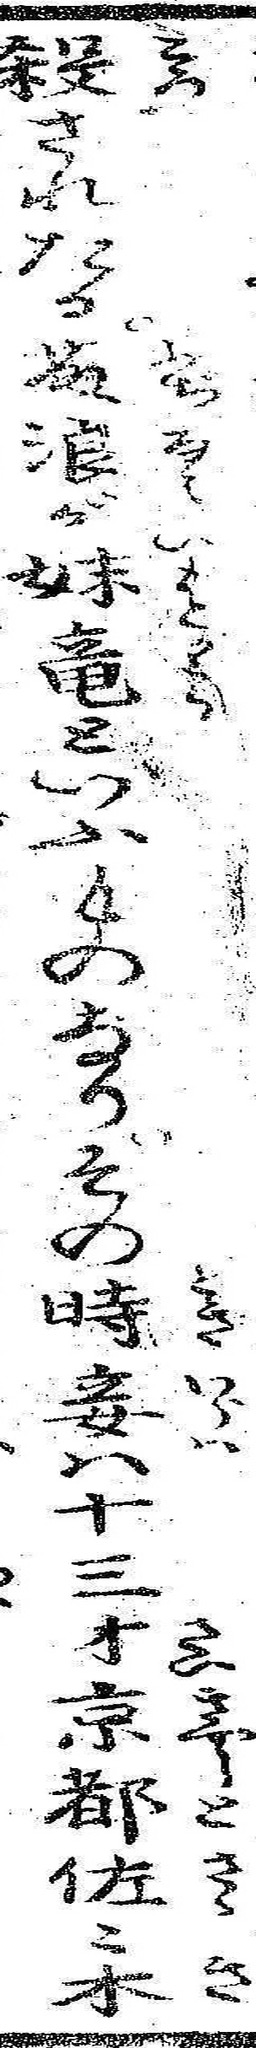殺されたる。藤浪が妹竜といふものなり。その時妾は十三才京都佐々木
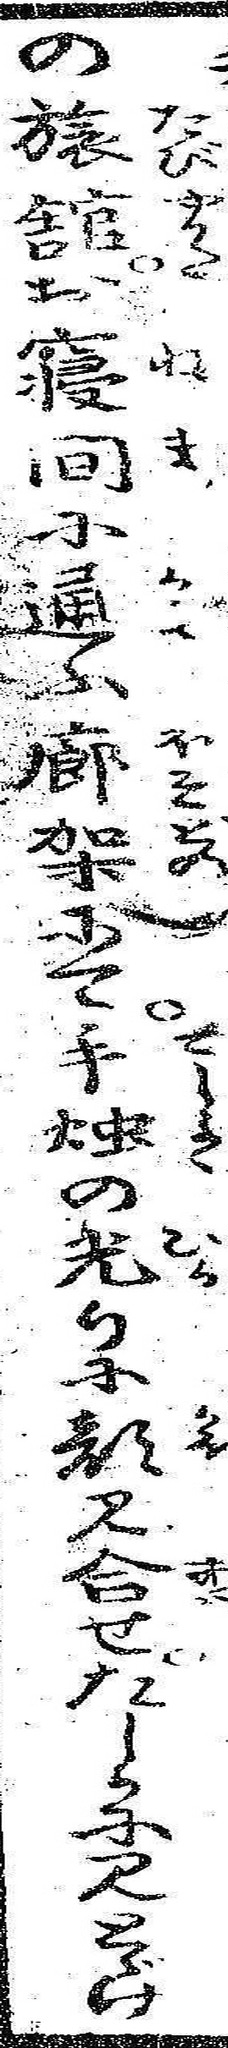の旅館。お寝間に通ふ廊架にて。手燭の光りに顔見合せ。たしかに見とゞけ
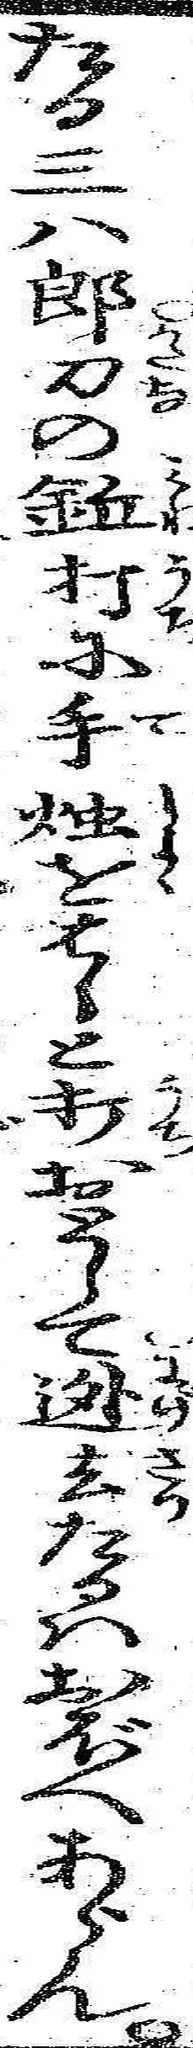たる三八郎。刀の打に手燭をはしと打おとして。逃去たるはおぼへあらん。
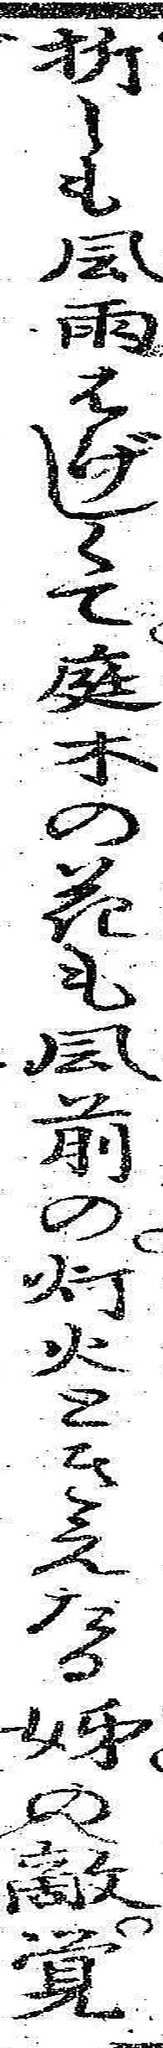折しも風雨はげしくて。庭木の花も風前の。灯火ときえたる姉の敵。覚
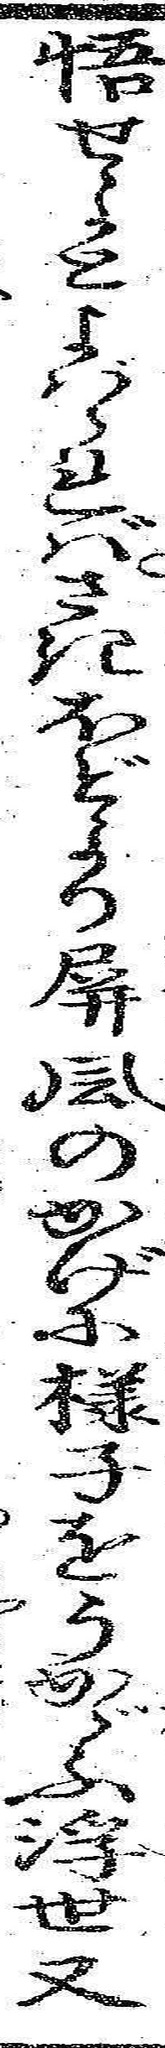悟せよとよばゝれば。さきほどより屏風のかげに。様子をうかゞふ浮世又
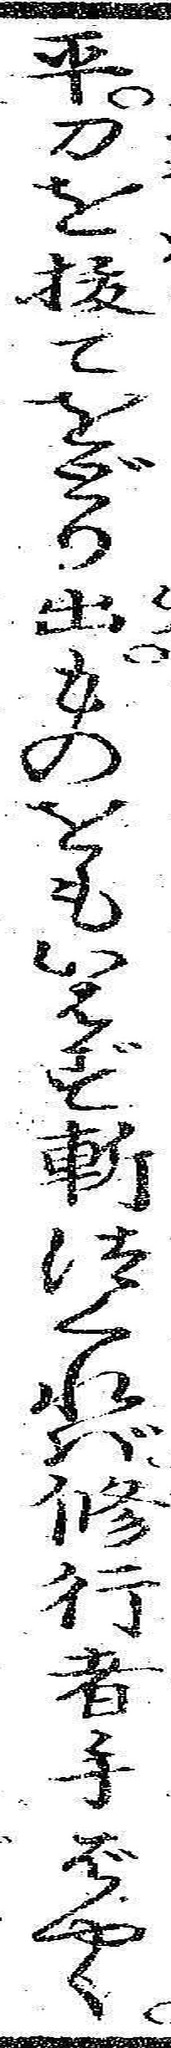平。刀を抜てをどり出。ものをもいはず斬つくれば。修行者手ばやく。
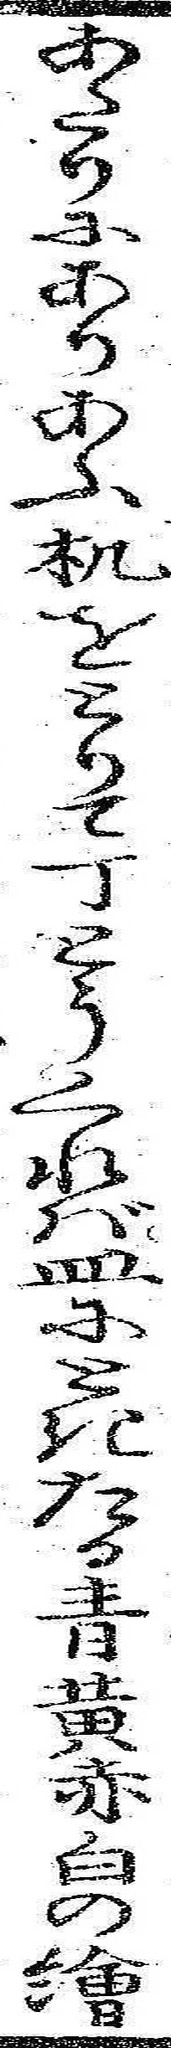あたりにありあふ机をとりて丁とうくれば。皿にときたる青黄赤白の絵
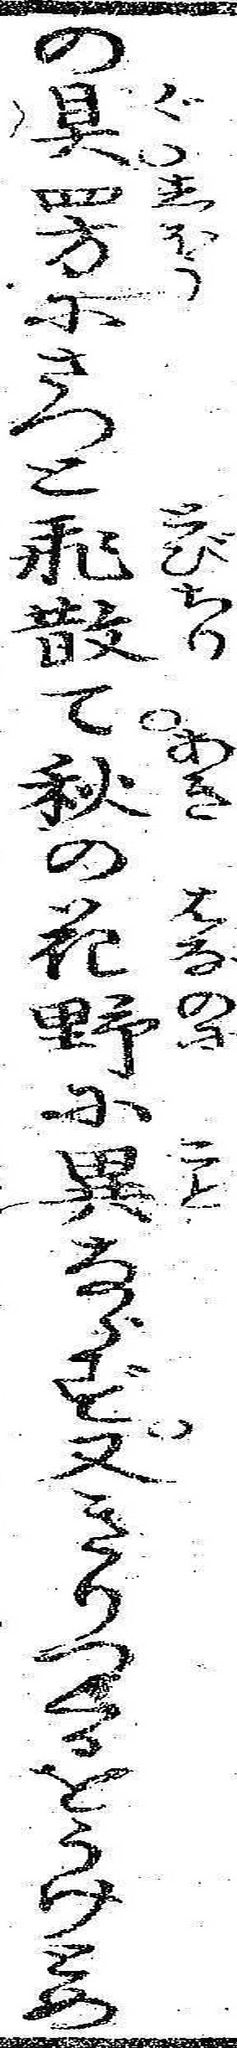の具。四方にさつと飛散て。秋の花野に異ならず。又きりつくるをうけとめ
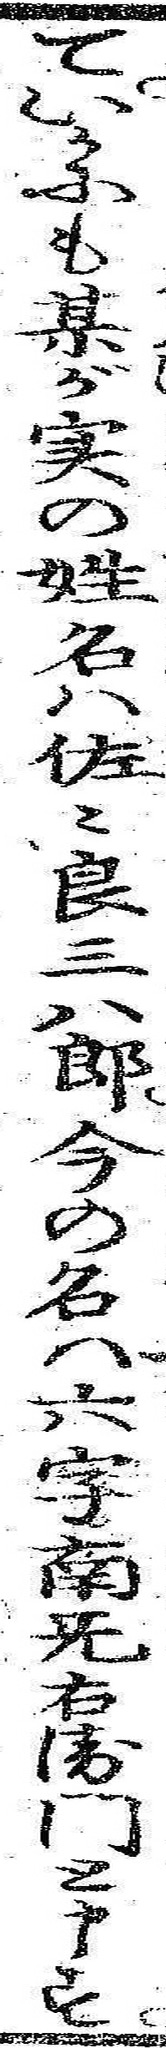て。いかにも某が実の姓名は佐々良三八郎。今の名は六字南無右衛門と申す。
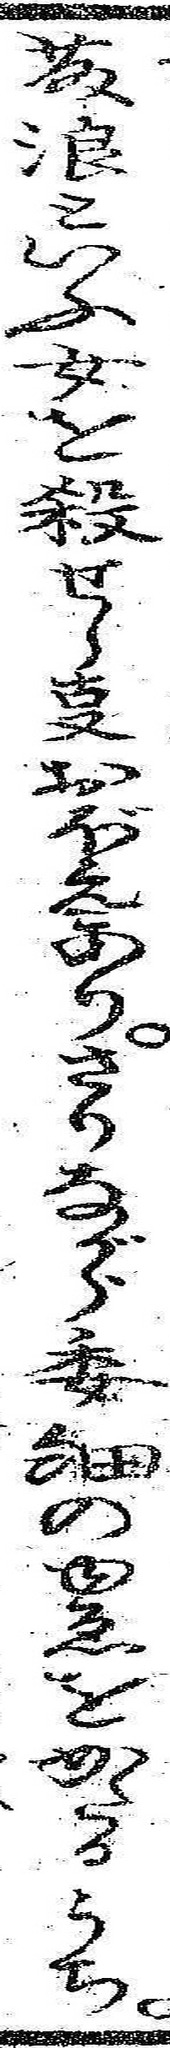藤浪といふ女を殺せし事おぼえあり。さりながら委細のゆゑをかたるうち。
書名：昔話稲妻表紙
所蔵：国文学研究資料館
